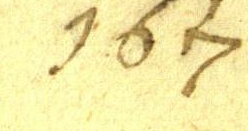167
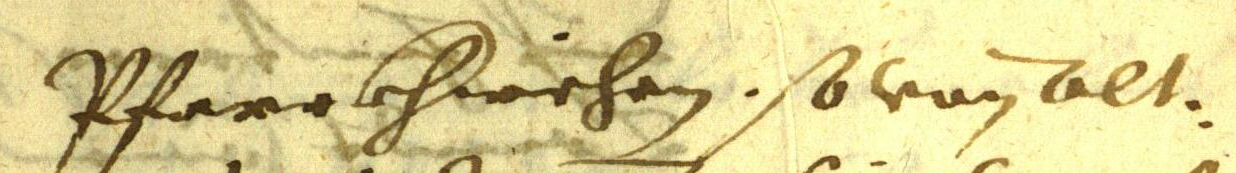Pfarrkhirchen. so von Alt¬
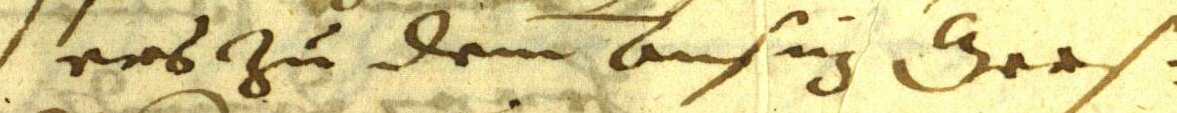ers Zū dem Ansiz Gers¬
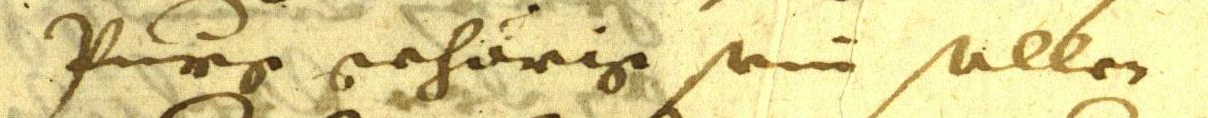Pūrg gehörig sein sollen
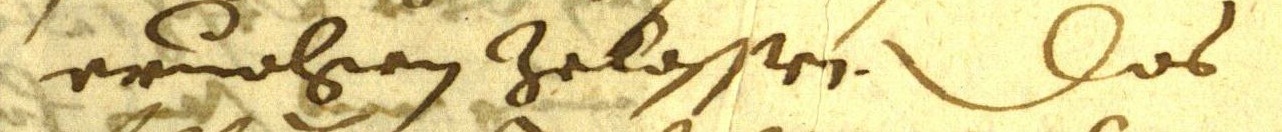erūolgen Zelassen. Das
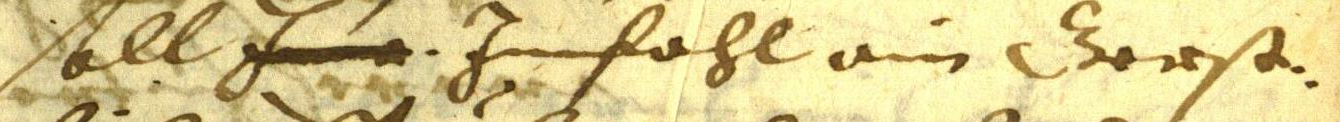soll Ime Innfahl ain Gerst¬
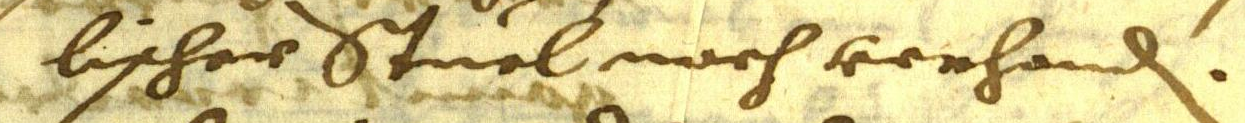licher Stūel noch verhand.
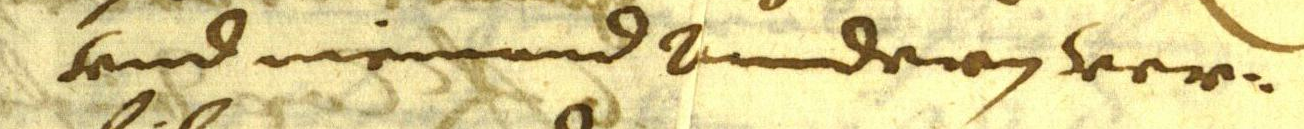vnd niemand Anndern ver¬
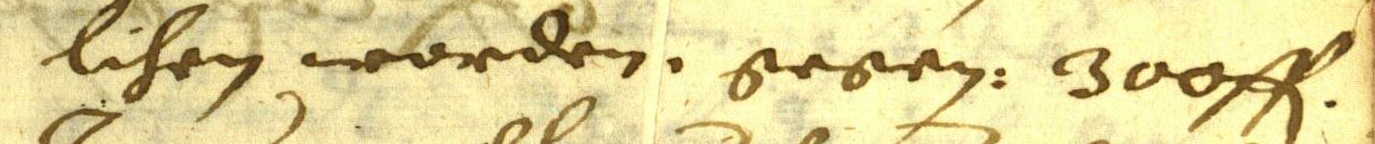lihen worden. gegen: 300 fl.
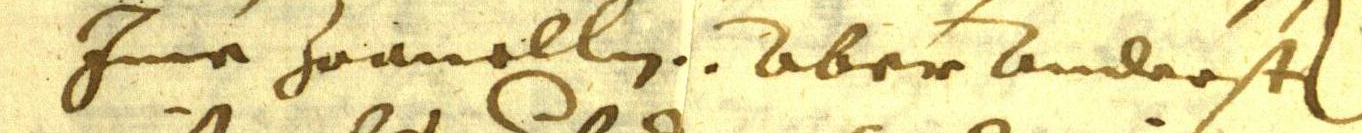Ime Zoanelln: aber Anderst
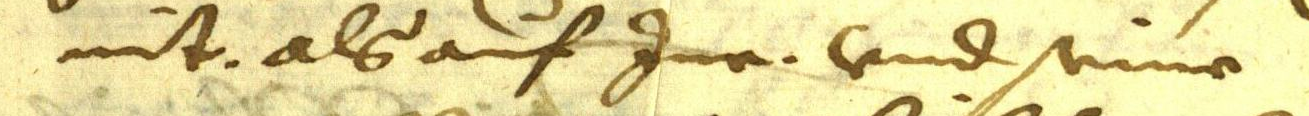nit. als aūf Ine. vnd seine
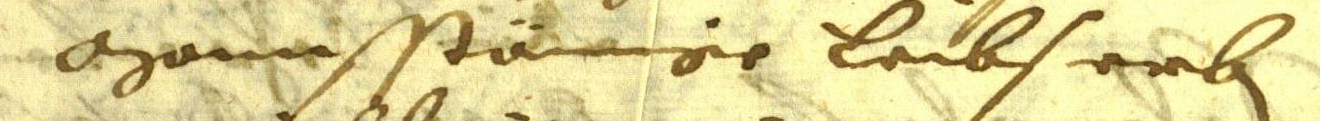Mannsstämige Leibserb
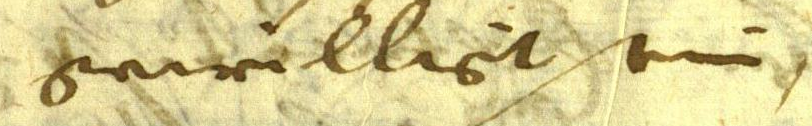gewilligt sein,
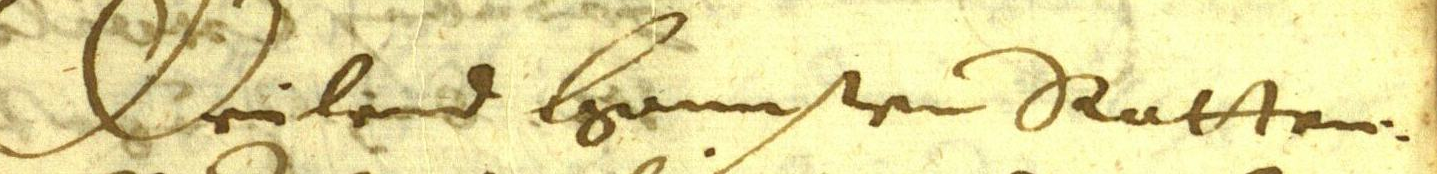Weilend Hannsen Rotten¬
